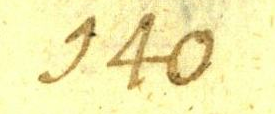140
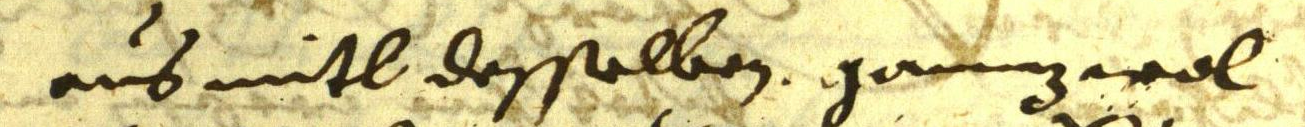aūs mitl desselben. gannz wol
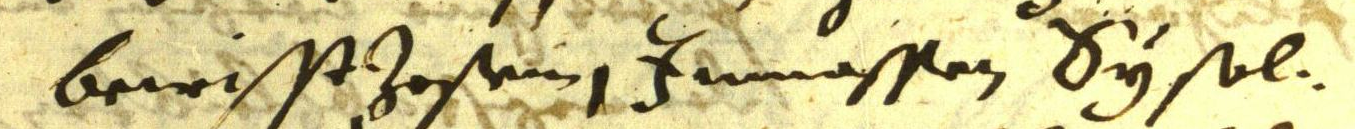bewisst Zesein, Inmassen Sȳ sol¬
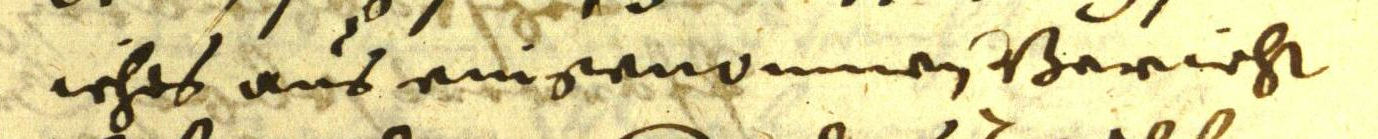iches aūs ein genomnen Bericht
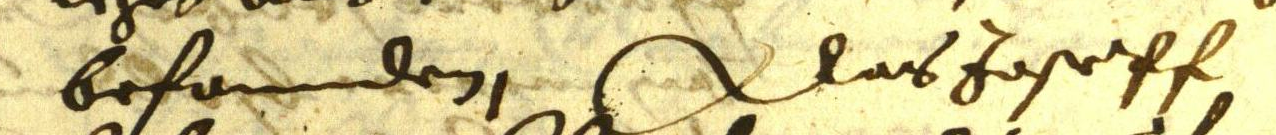befannden, Das Joseff
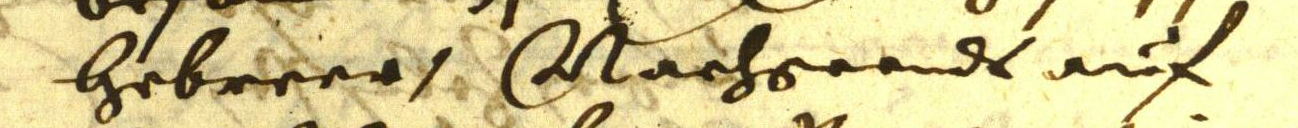Hebreer, Nachgeends aūf
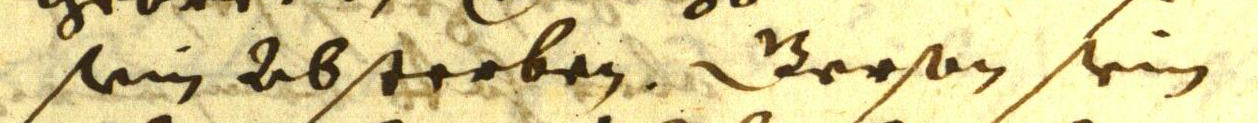sein Absterben. Gerson sein
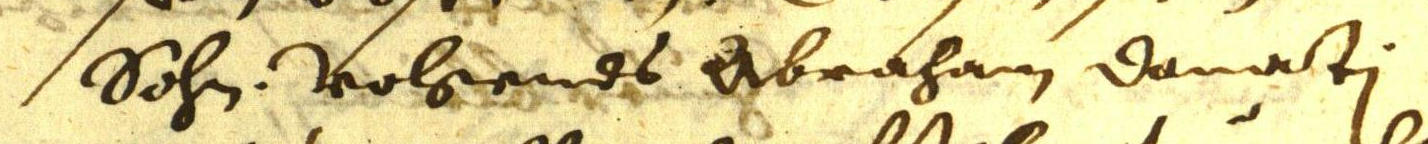Sohn. volgends Abraham Danatj
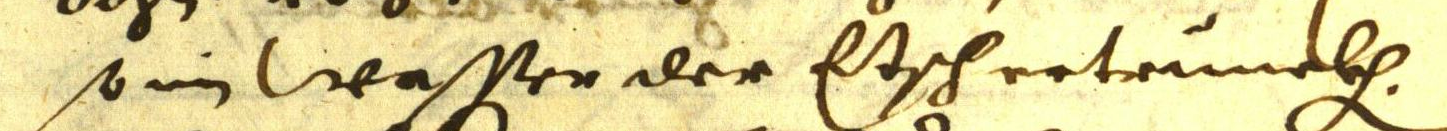so im Wasser der Etsch ertrūnckh.
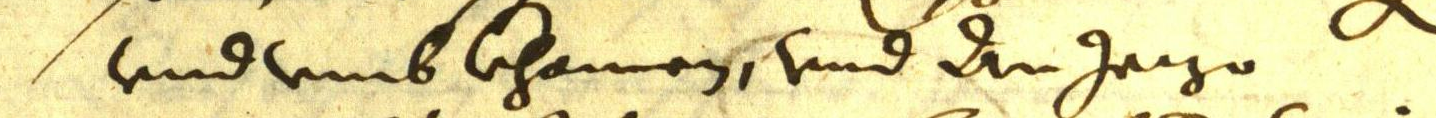vnd vmb khomen, vnd An Jezo
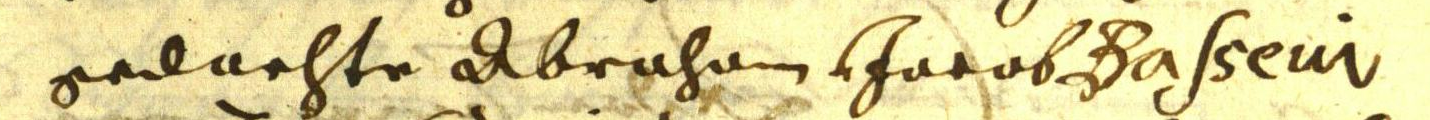gedachte Abraham Jacob Basseni
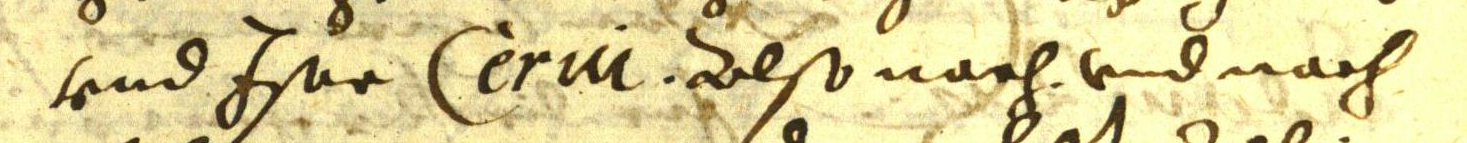vnd Isac Cerni. Also nach. vnd nach
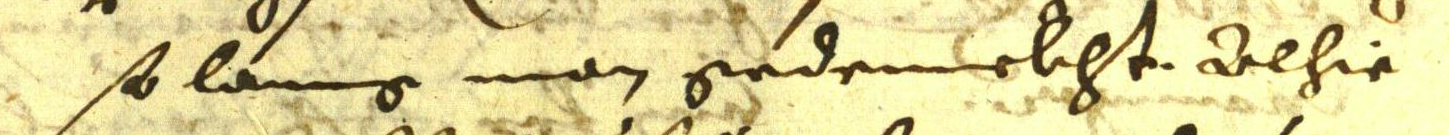so lanng man gedennckht. Alhie
